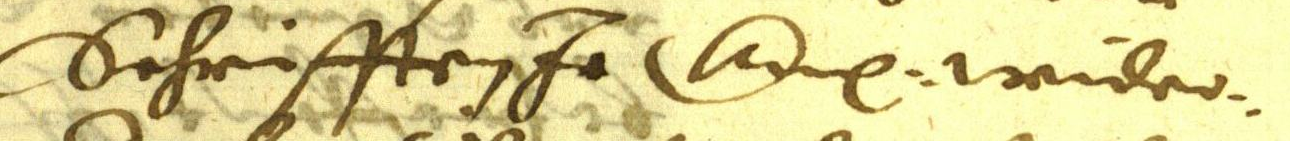Schrifften Ir Gn: wider¬
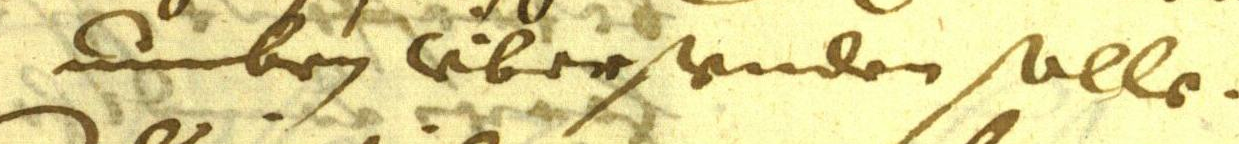ūmben v̈bersenden solle.
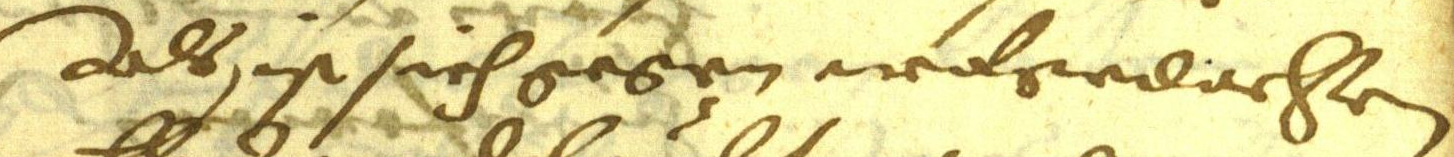Als ist sich gegen wolgedachten
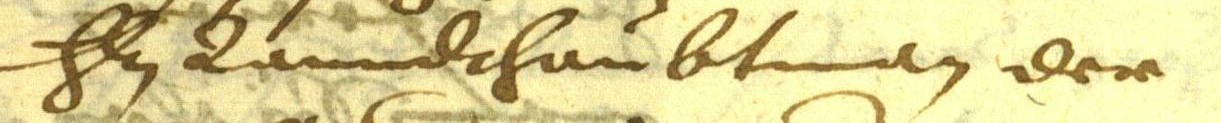hln Lanndthaūbtman der
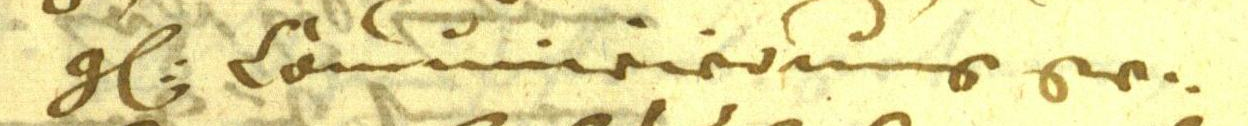g: Comūnicierūng ge¬
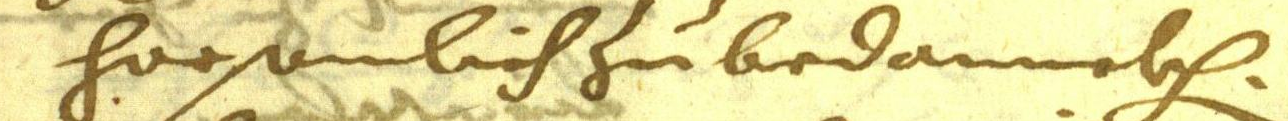horsamlich Zū bedannckh.
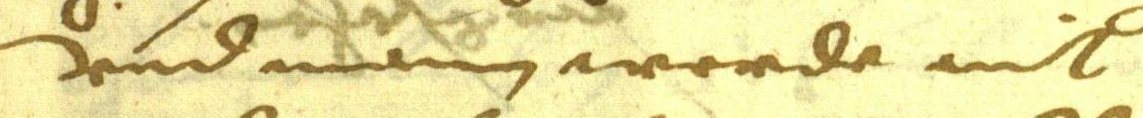vnd mann werde nit
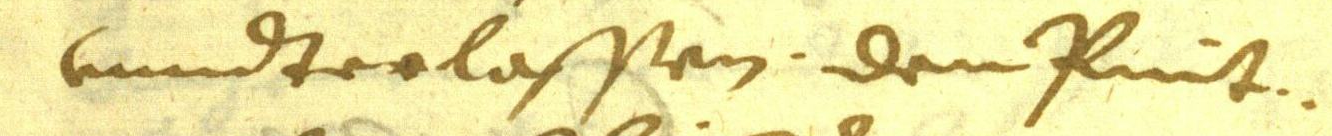vnndterlassen. den Pint¬
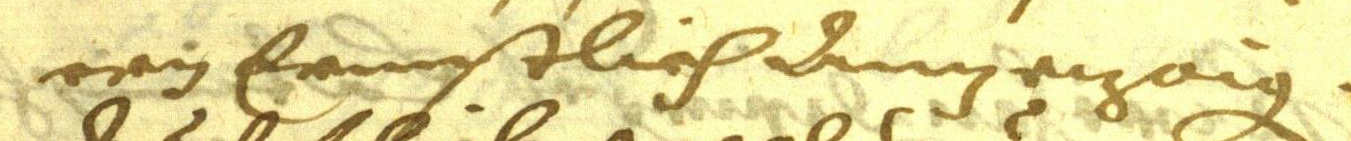ern Ernnstlich Anzezaig.
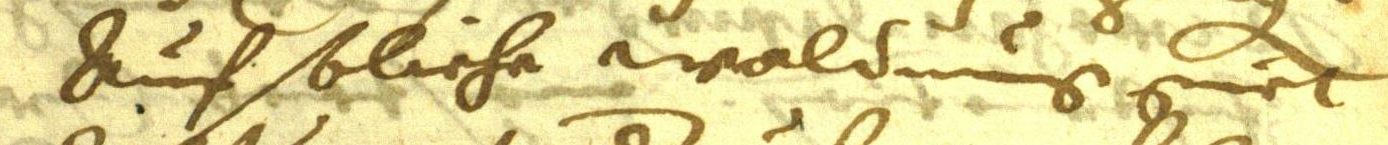Aūf soliche waldūng gūet
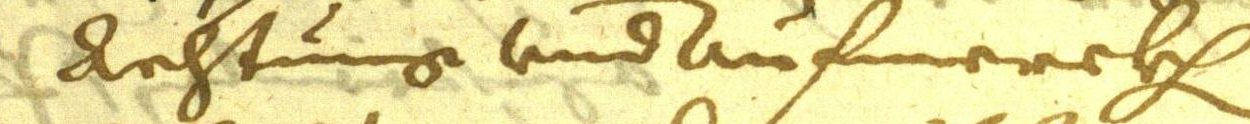Achtūng vnd Aūfmerckh
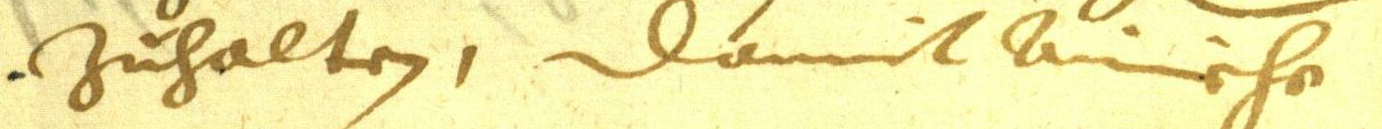Zūhalten, damit Ainiche
